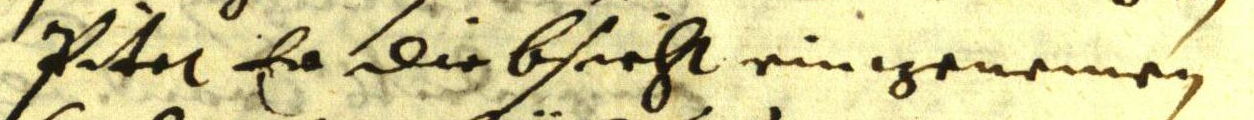Pitet Er die bsicht einzenemen
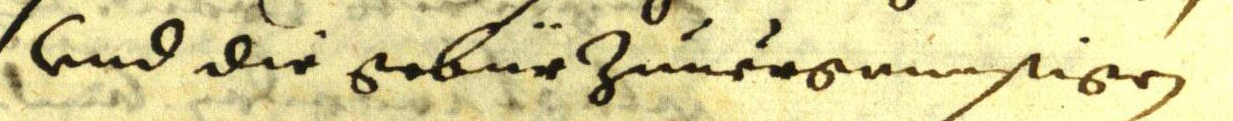vnd die gebür Zūuērgonnstigen.
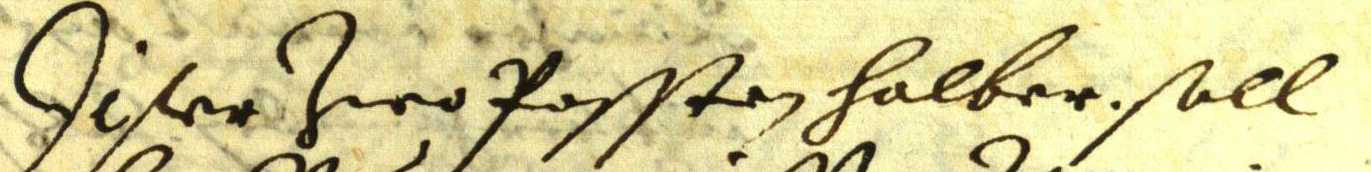Diser Zwo Possten halber. soll
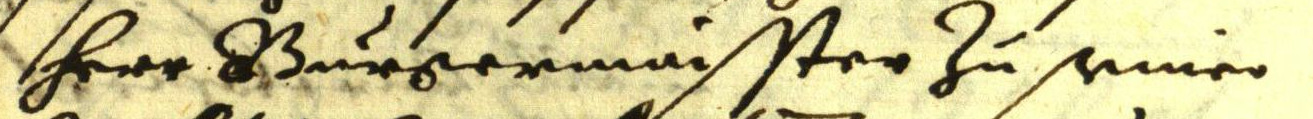herr Būrgermaisster Zū seiner
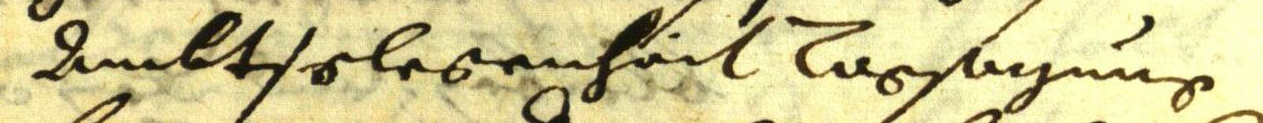Ambtsglegenhait Tagsazūng
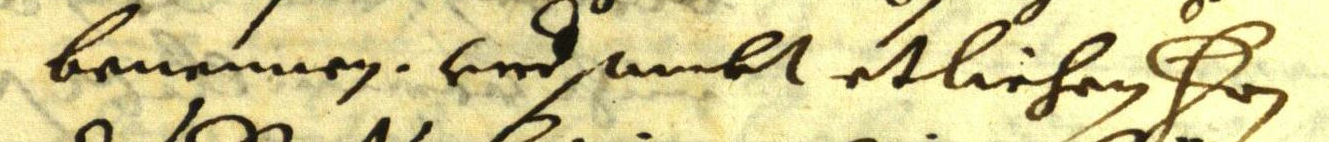benennen. vnd sambt etlichen H
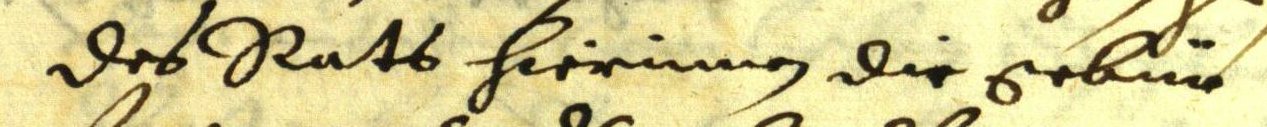des Rats hierinnen die gebür
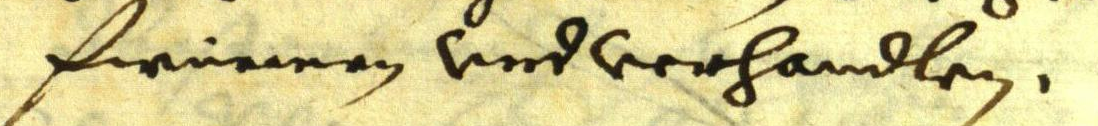firnemen vnd verhandlen.
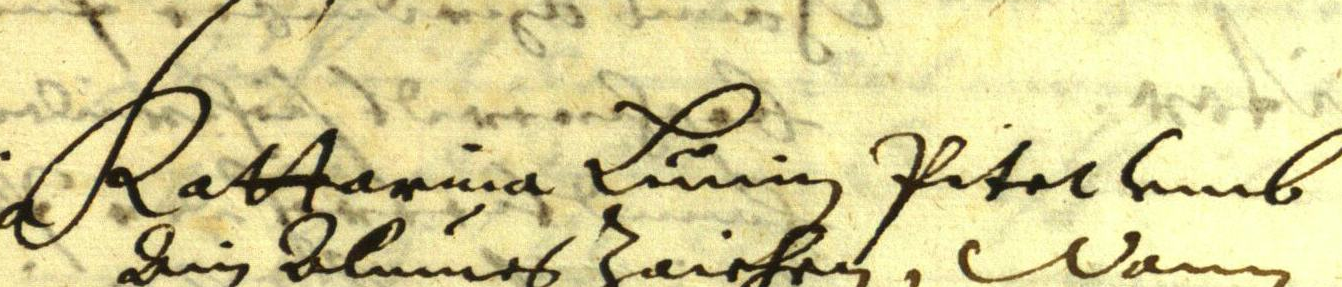Kattarina Lūnin Pitet vmb
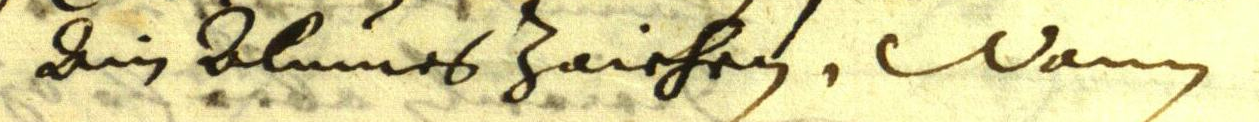Ain Almūes Zaichen, Wann
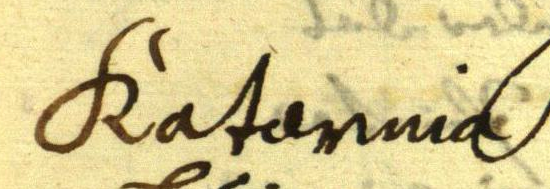Katarina
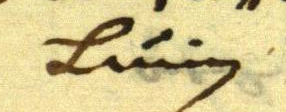Lūnin
